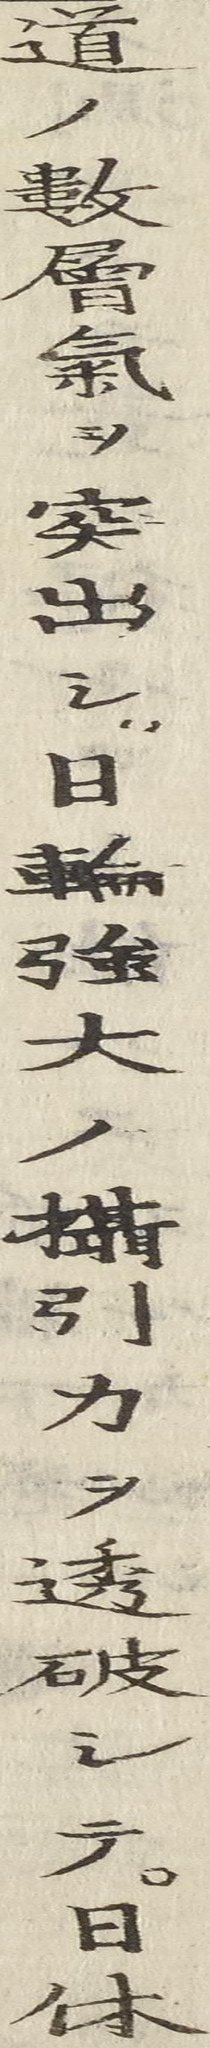道ノ数層気ヲ突出シ。日輪強大ノ摂引力ヲ透破シテ。日体
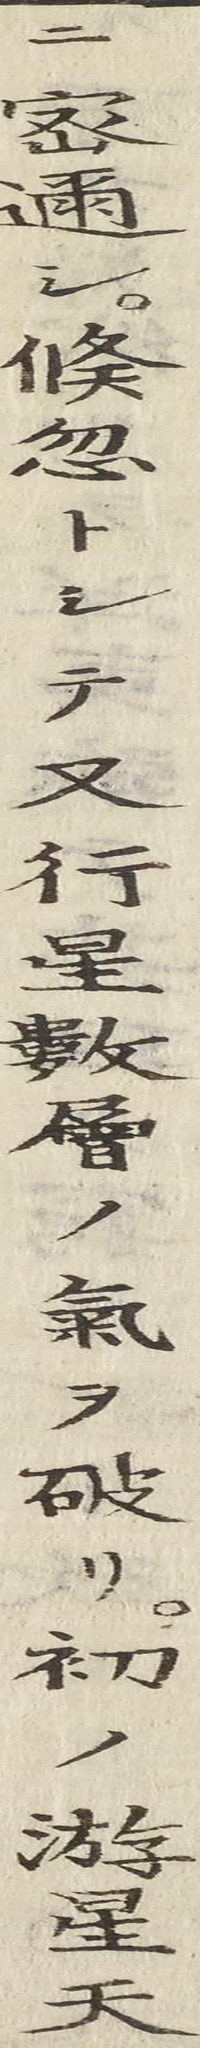ニ密邇シ。倏忽トシテ又行星数層ノ気ヲ破リ。初ノ游星天
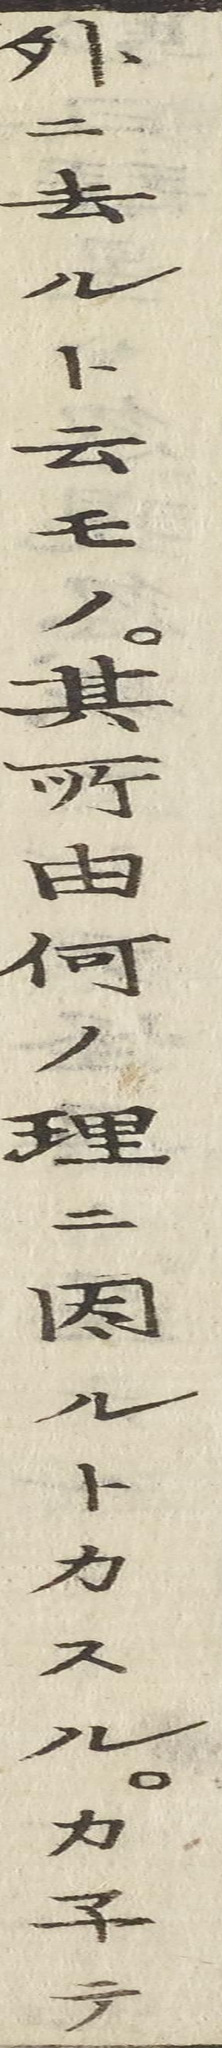外ニ去ルト云モノ。其所由何ノ理ニ因ルトカスル。カ子テ
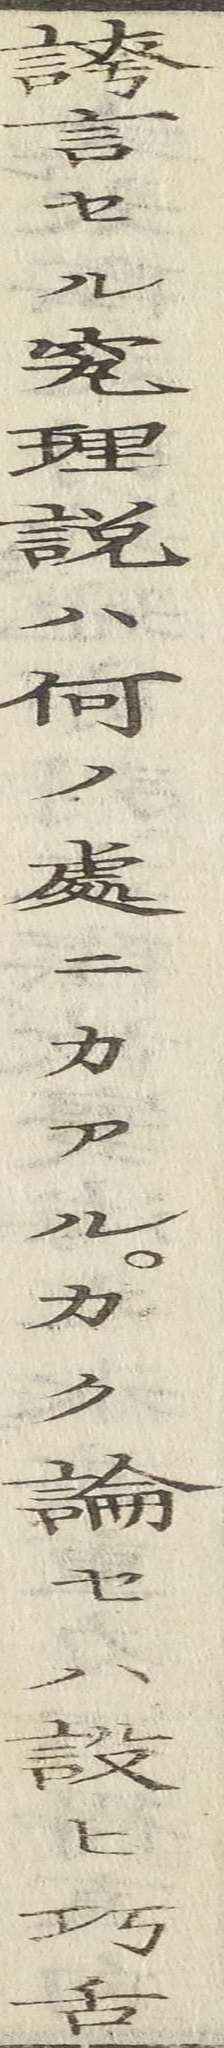誇言セル究理説ハ何ノ処ニカアル。カク論セハ設ヒ巧舌
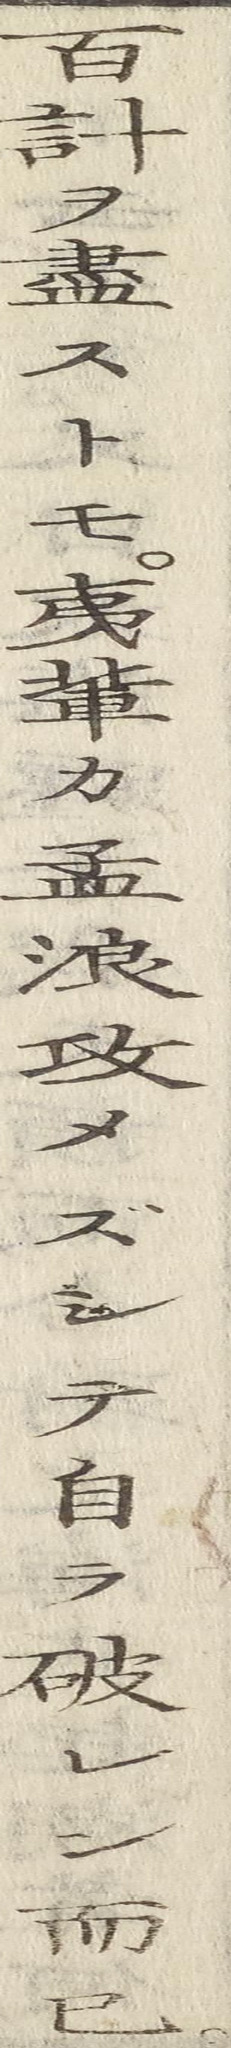百計ヲ尽ストモ。夷輩カ孟浪攻メズシテ自ラ破レン而已。
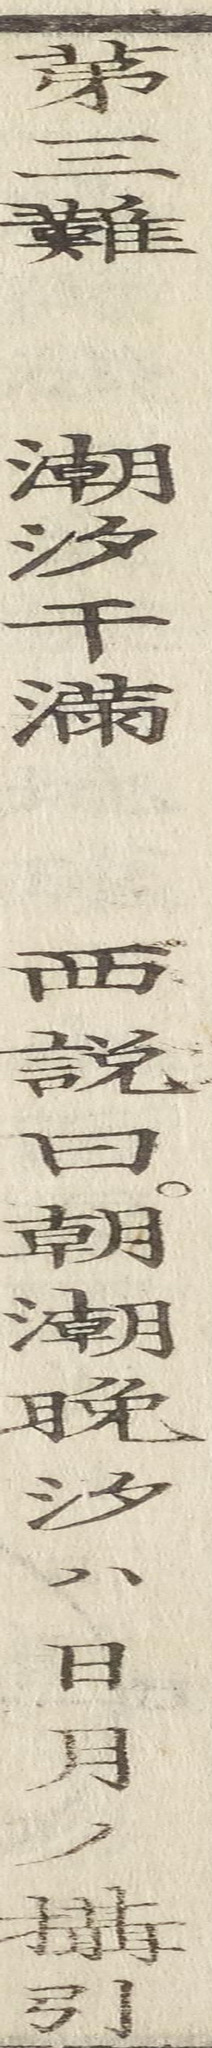第三難潮汐干満西説曰。朝潮晩汐ハ日月ノ摂引
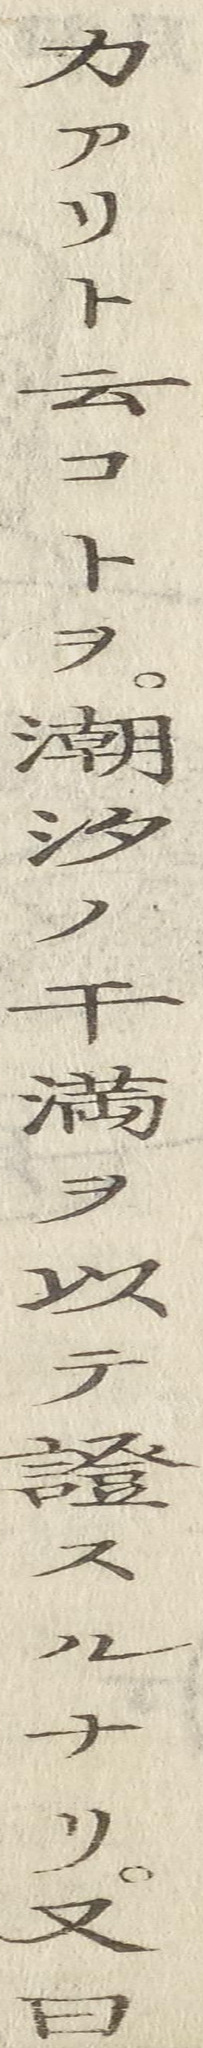力アリト云コトヲ。潮汐ノ干満ヲ以テ証スルナリ。又曰
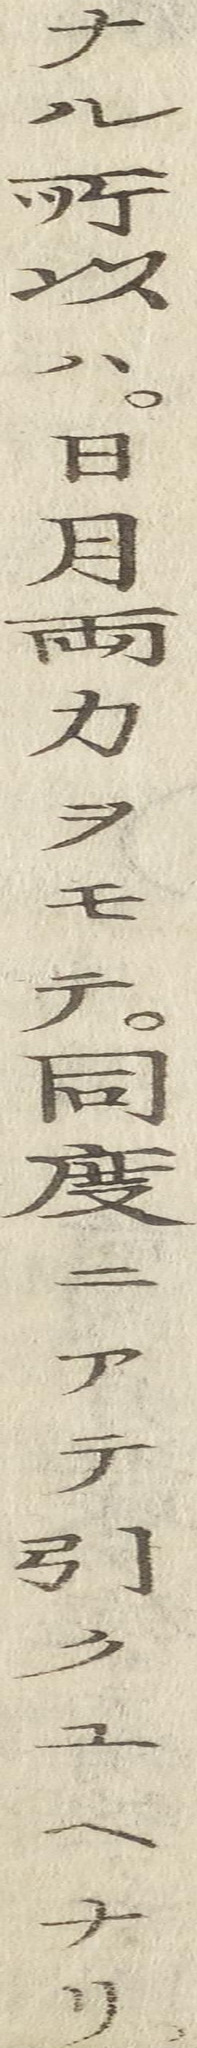ナル所以ハ。日月両力ヲモテ。同度ニアテ引クユヘナリ。

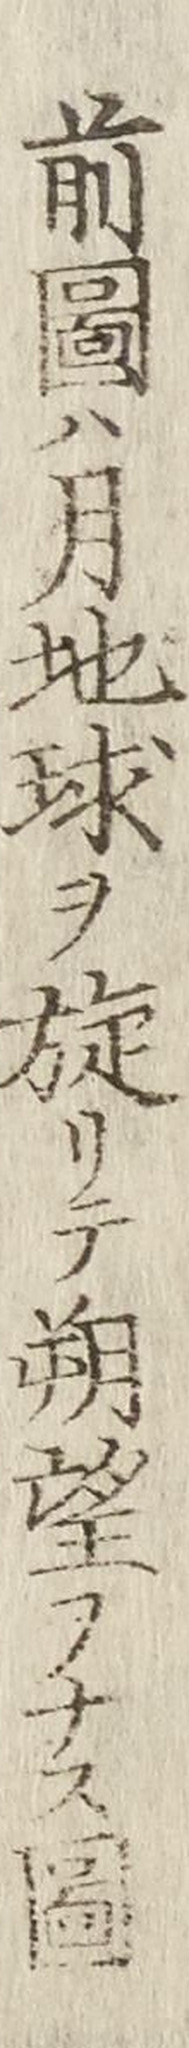前図ハ月地球ヲ旋リテ朔望ヲナス図
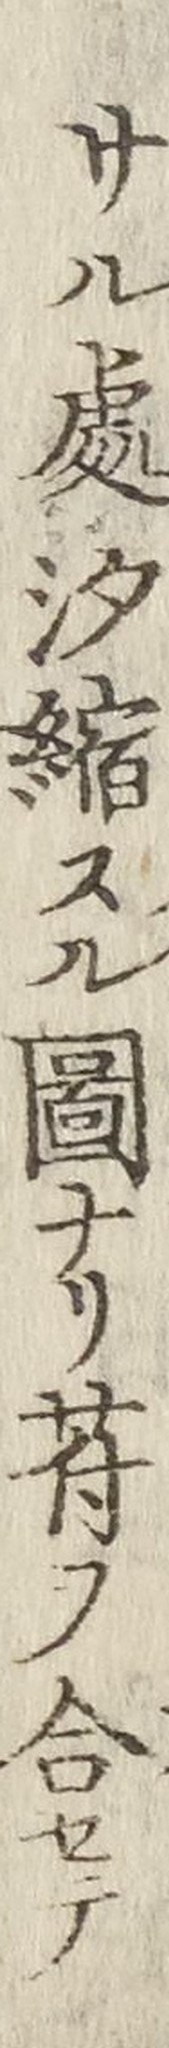サル処汐縮スル図ナリ苻フ合セテ
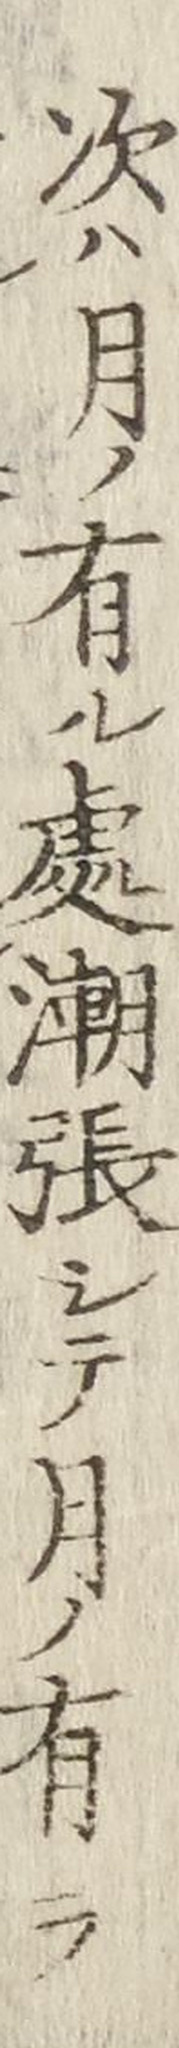次ハ月ノ有ル処潮漲シテ月ノ有ラ
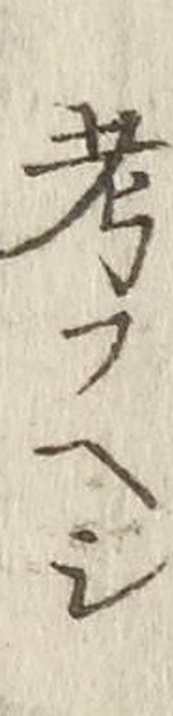考フヘシ
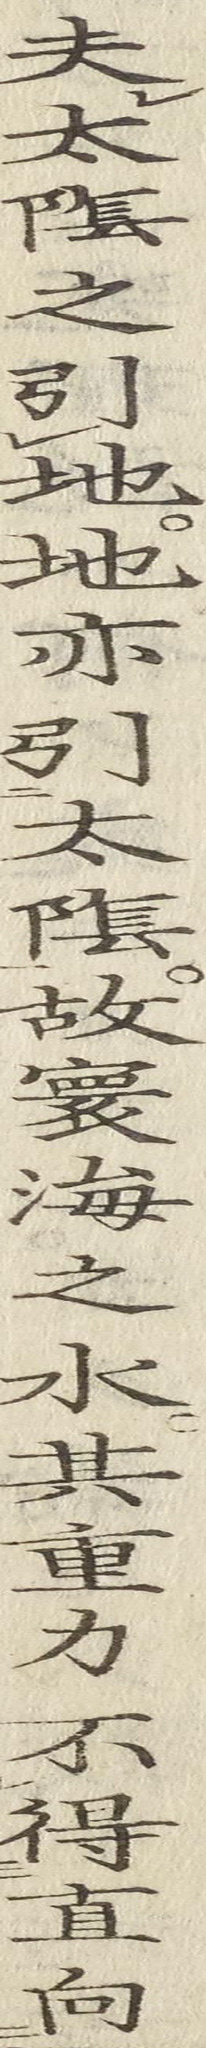夫太陰之引地。地亦引ニ太陰。故寰海之水。其重力不得直向ニ
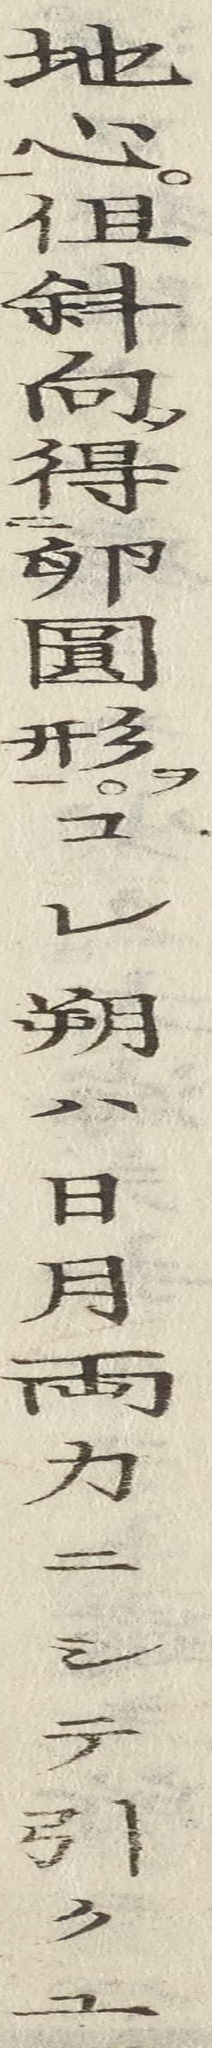地心。但斜向得ニ卵円形。コレ朔ハ日月両力ニシテ引クユ
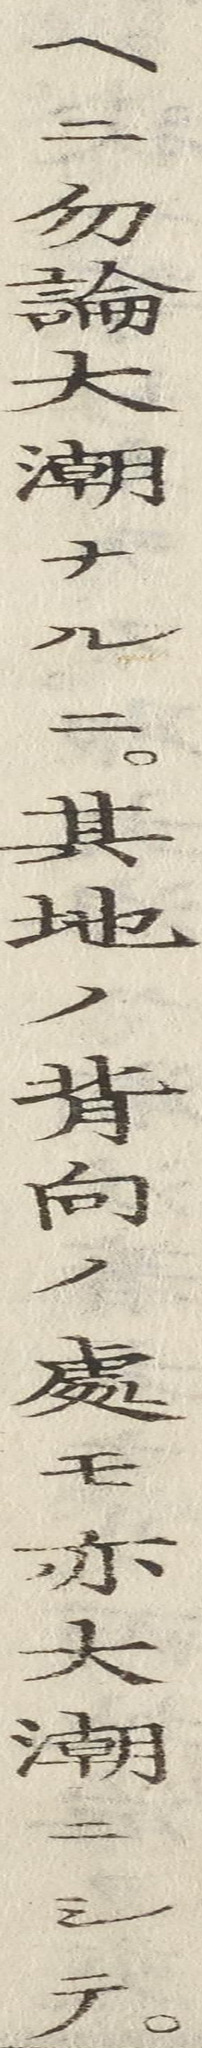ヘニ勿論大潮ナルニ。其地ノ背向ノ処モ亦大潮ニシテ。
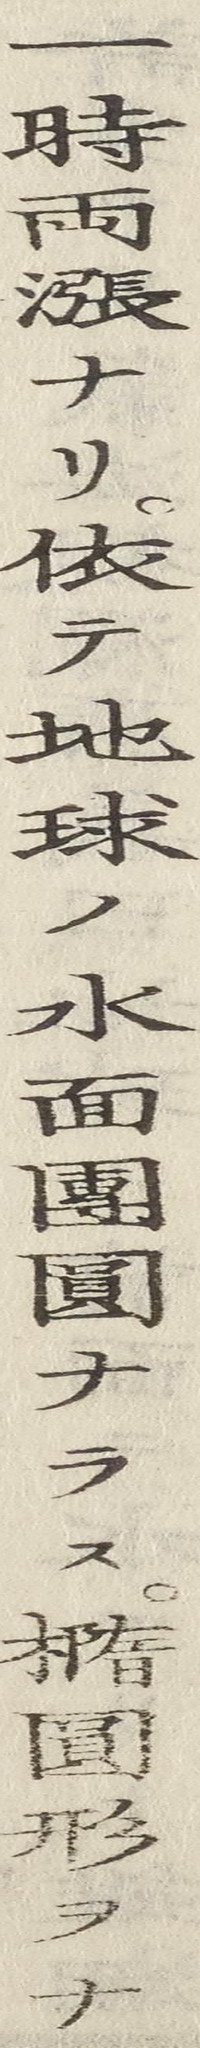一時両漲ナリ。依テ地球ノ水面団円ナラス。楕円形ヲナ
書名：護法新論　二編　下
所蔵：東京大学地震研究所図書室 Earthquake Research Institute Library, The University of Tokyo, JAPAN
